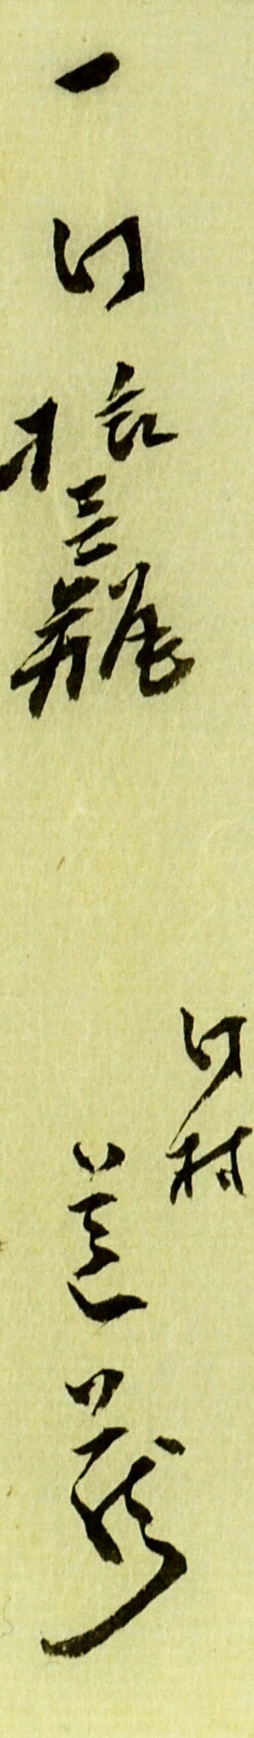一同拾壱瓶道蔵
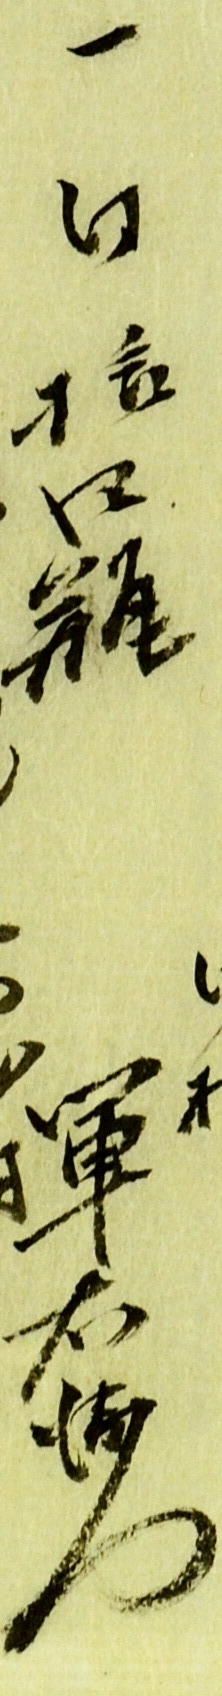一同拾四瓶軍右衛門
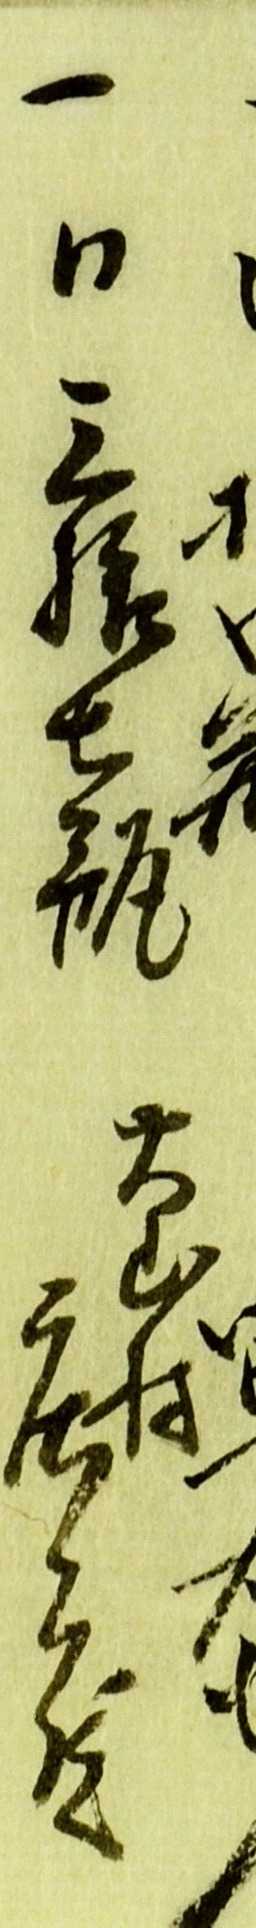一同三拾七瓶庄蔵
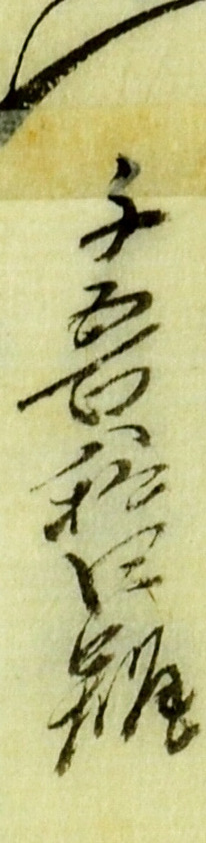〆千五百八拾四瓶
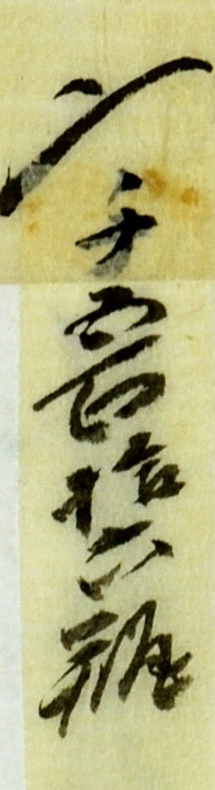〆千五百拾六瓶
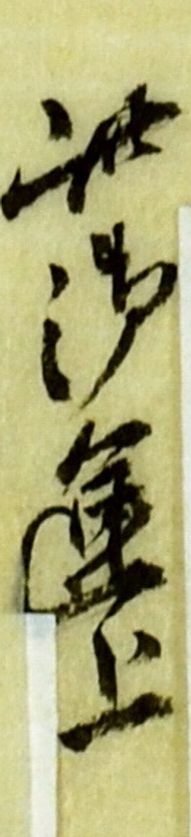此御運上
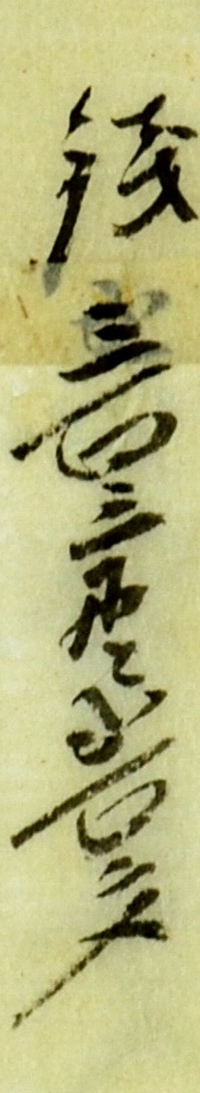銭三百三貫弐百文

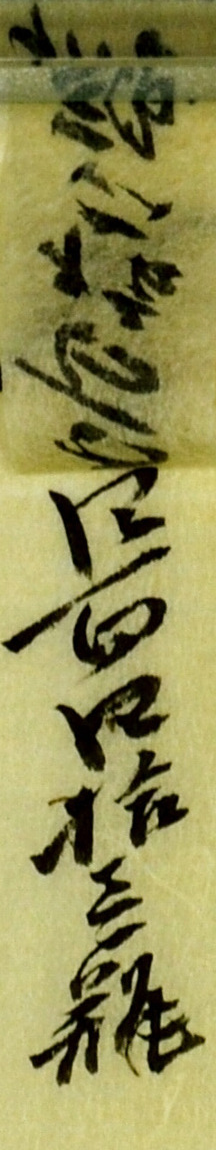四百四拾壱瓶

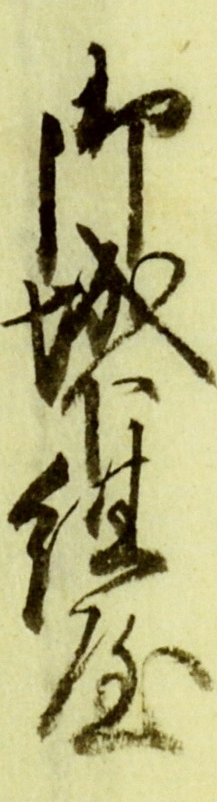御城下紺屋
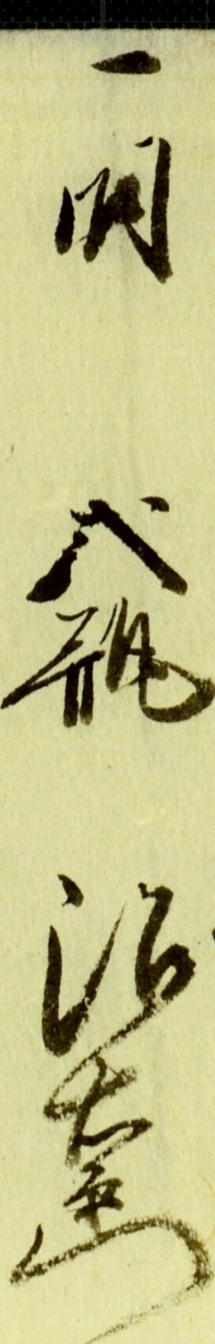一同弐瓶治右衛門
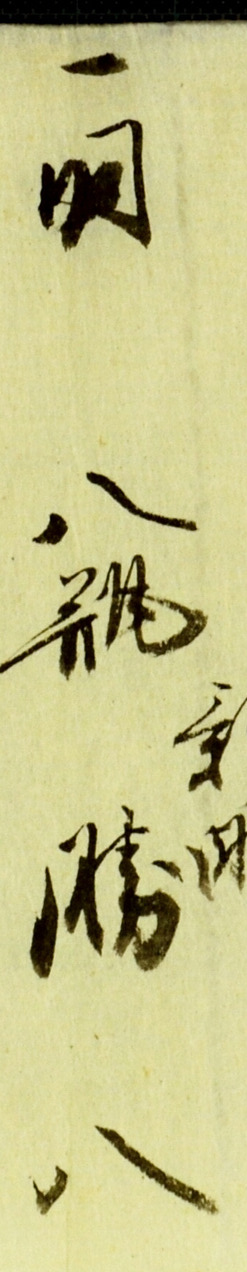一同八瓶勝八
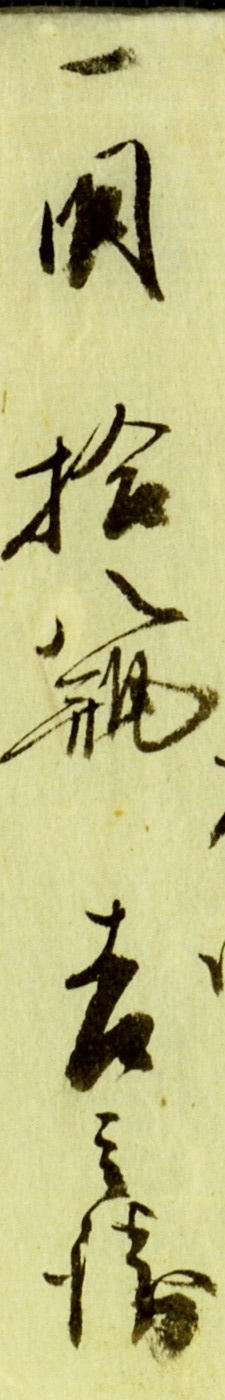一同拾八瓶吉兵衛
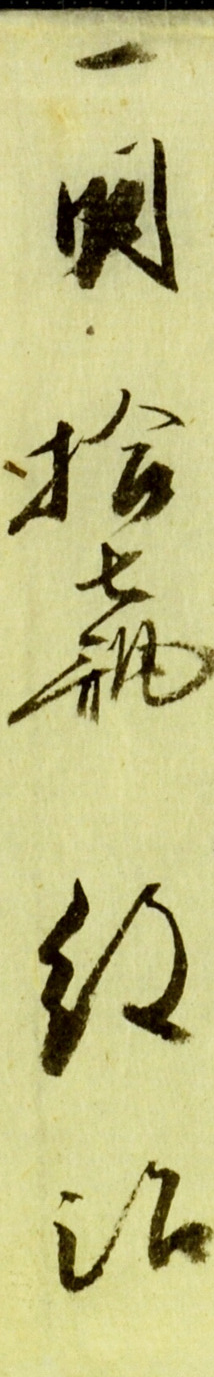一同拾七瓶紋治
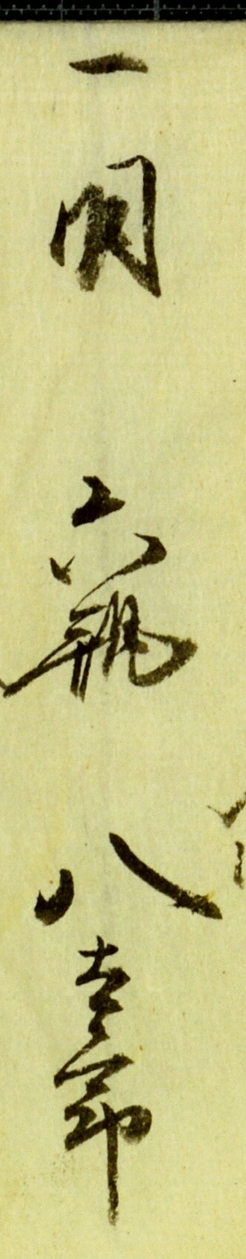一同六瓶八太郎

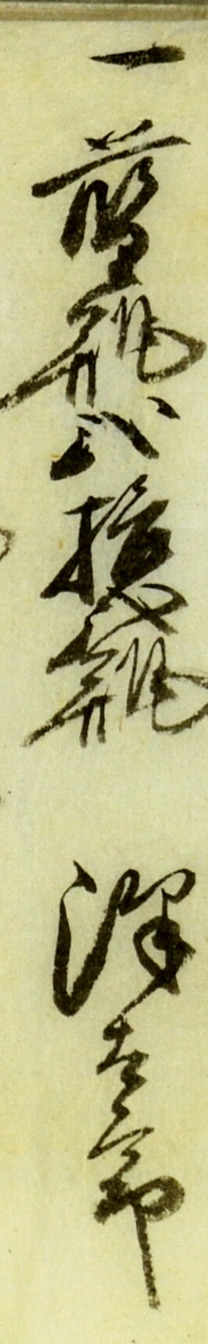一藍瓶弐拾弐瓶沢太郎
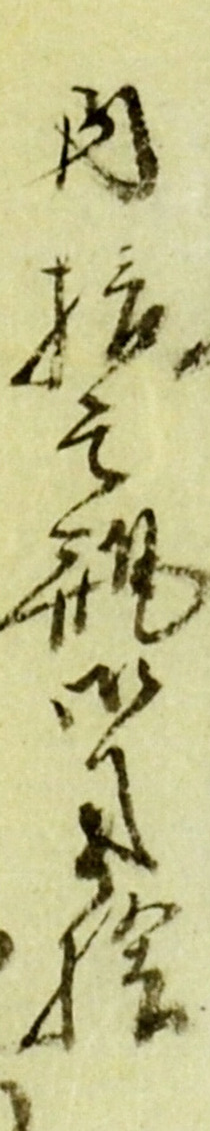内拾壱瓶御用捨
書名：御領分中御領分中紺屋藍瓶員数御改帳
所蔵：伊那市立高遠町図書館・合同会社AMANE
